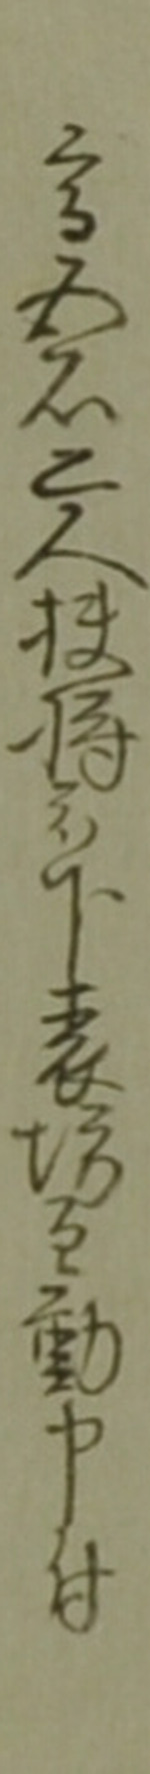高五石二人扶持被下表坊主勤申付
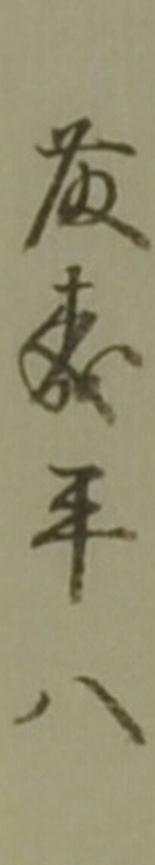藤森平八

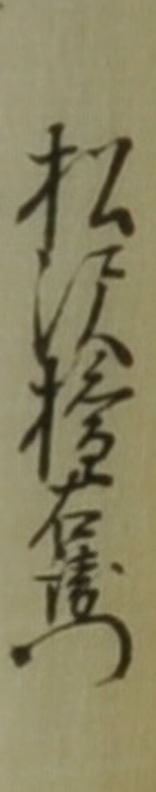松沢権右衛門
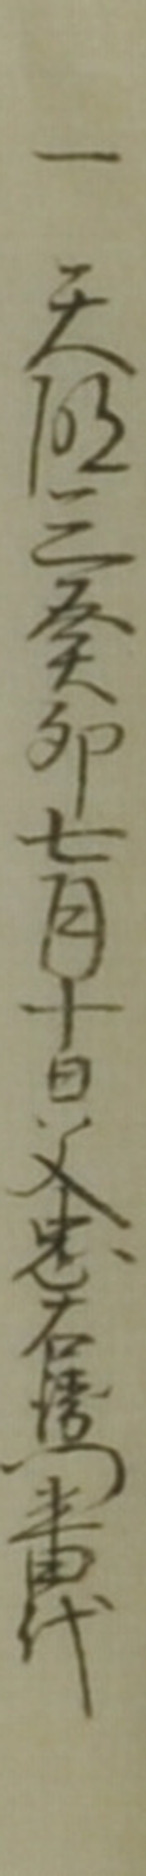一天明三癸卯七月十日父忠右衛門番代
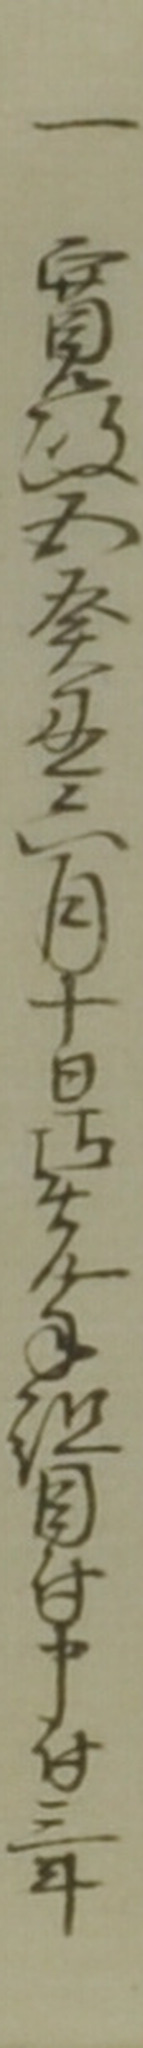一寛政五癸丑六月十日御先手組目付申付三斗
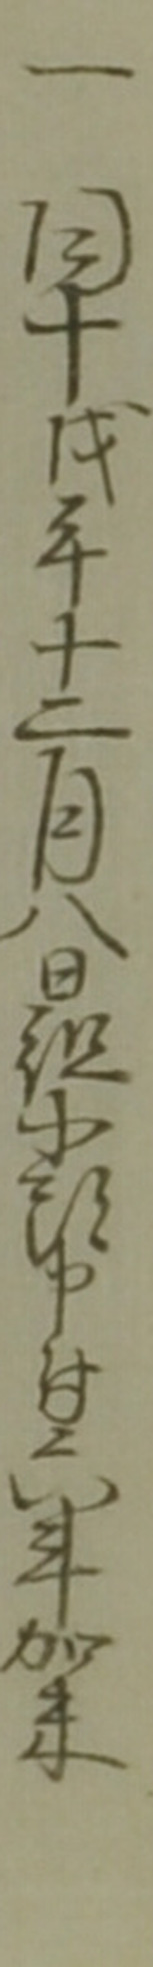一同十戊午十二月八日組小頭申付六斗加米
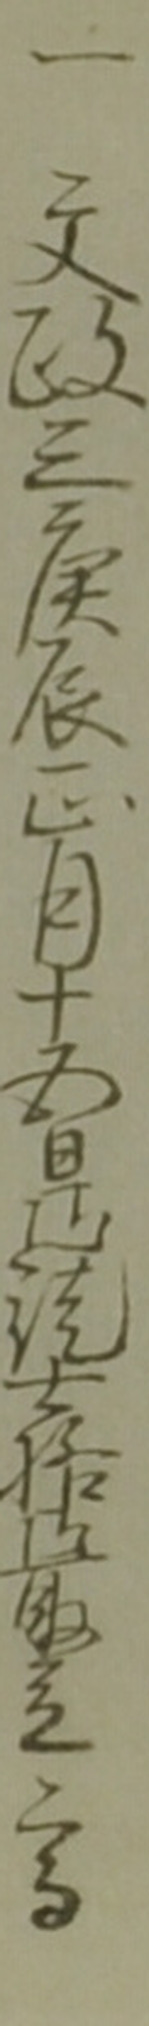一文政三庚辰正月十五日御徒士格御取立高
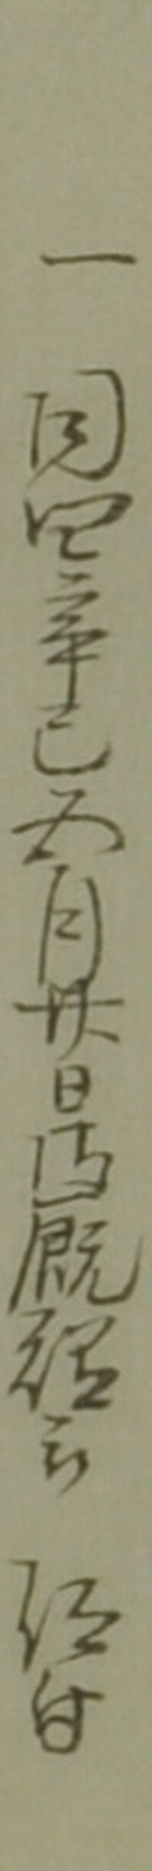一同四辛巳五月廿日御厩賄被仰付
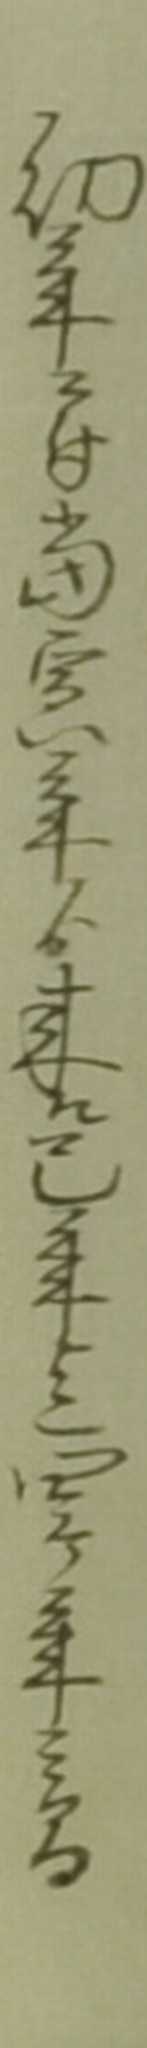幼年ニ付当寅年ゟ来ニ巳年迄四ヶ年之間
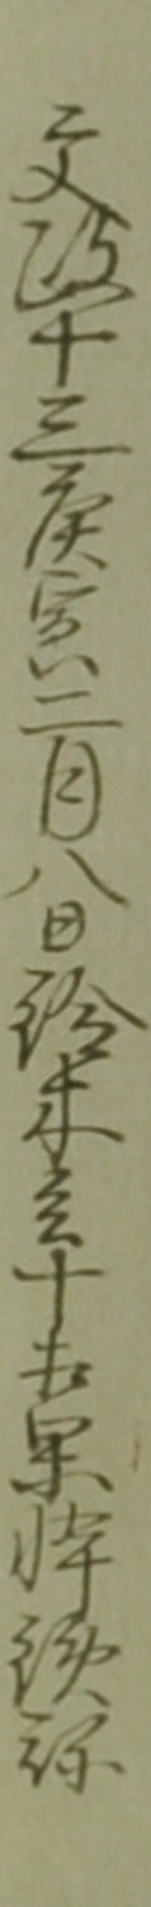一文政十三庚寅二月八日鈴木玄十相果忰鉄弥

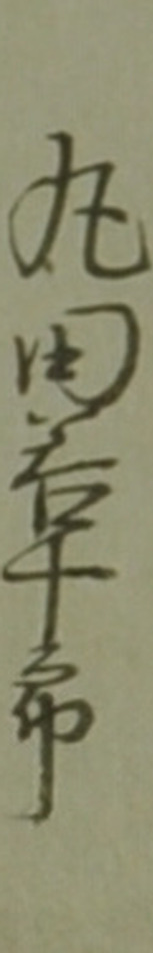丸田善十郎
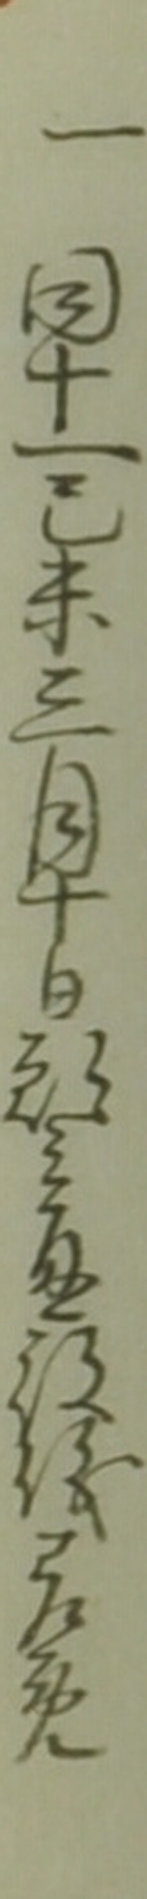一同十一己未三月十日願之通役儀差免
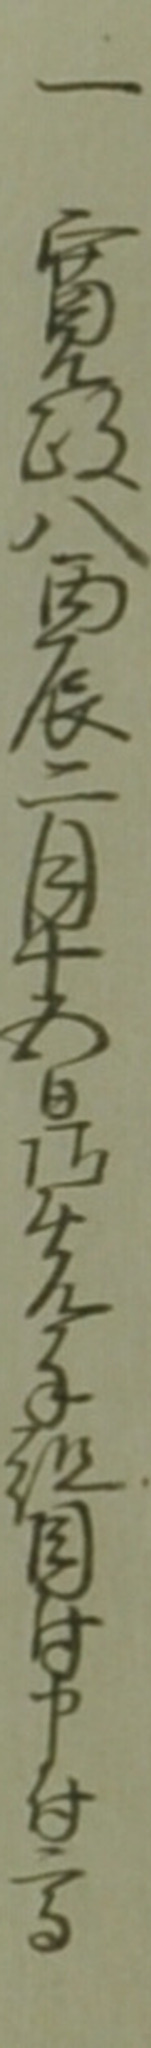一寛政八丙辰二月十五日御先手組目付申付高
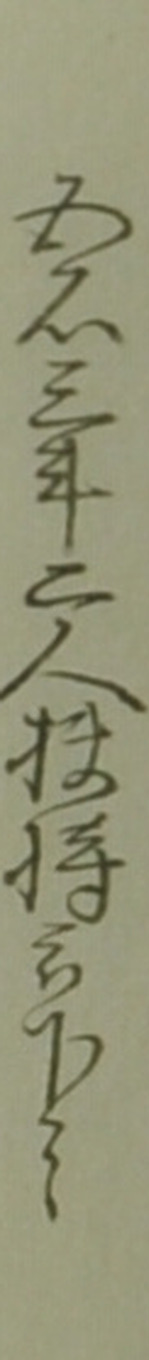五石三斗二人扶持被下之

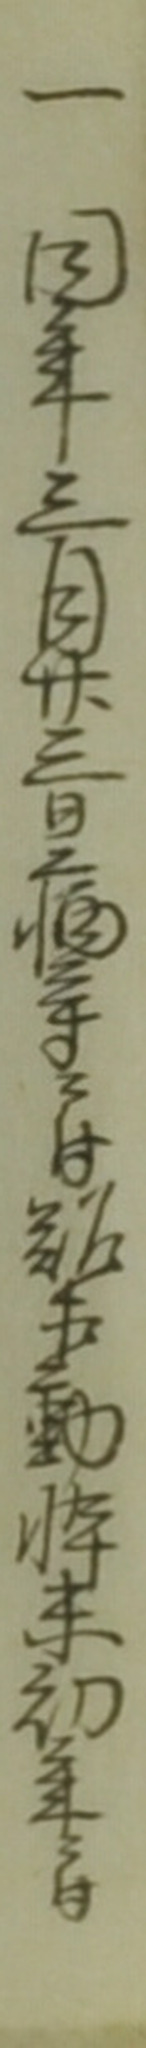一同年三月廿三日病気ニ付難相勤忰未幼年ニ付
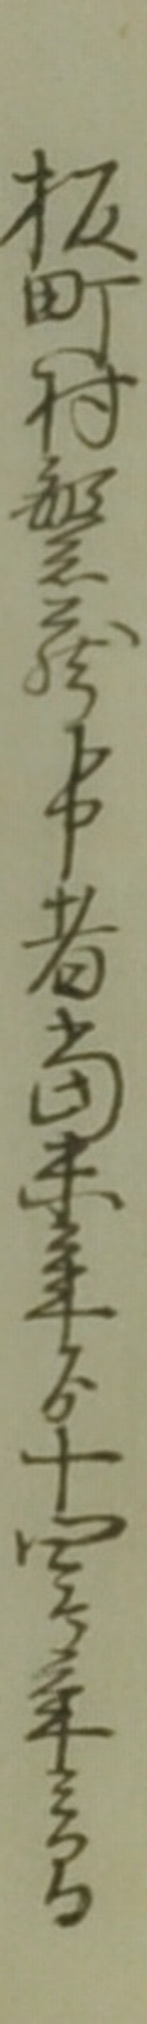板町村繁蔵ト申者当未年ゟ十四ヶ年之間
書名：無足諸士勤仕録（九）
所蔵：伊那市立高遠町図書館・合同会社AMANE
